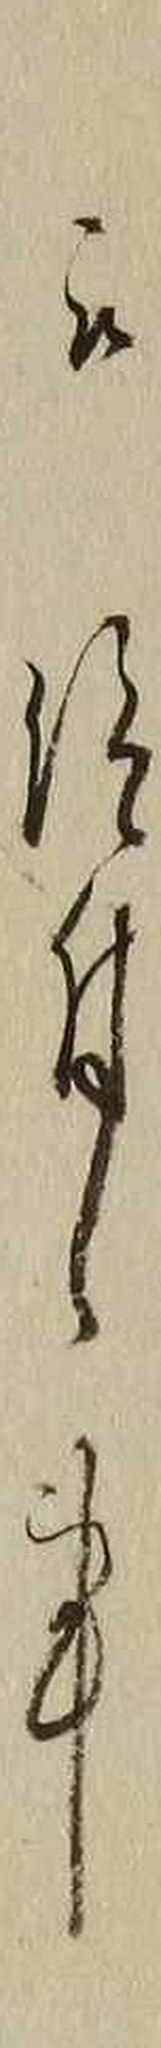被仰付候事
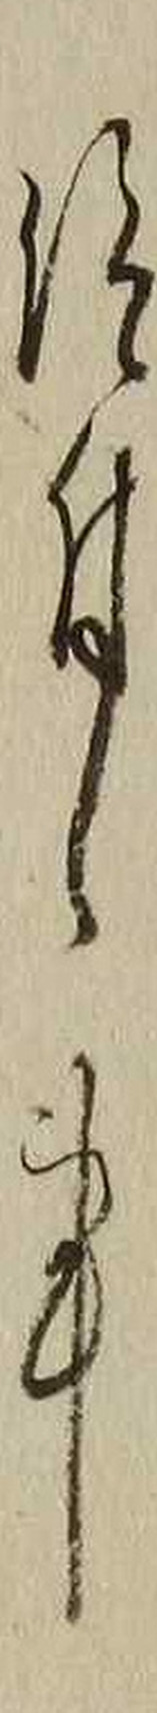仰付候事
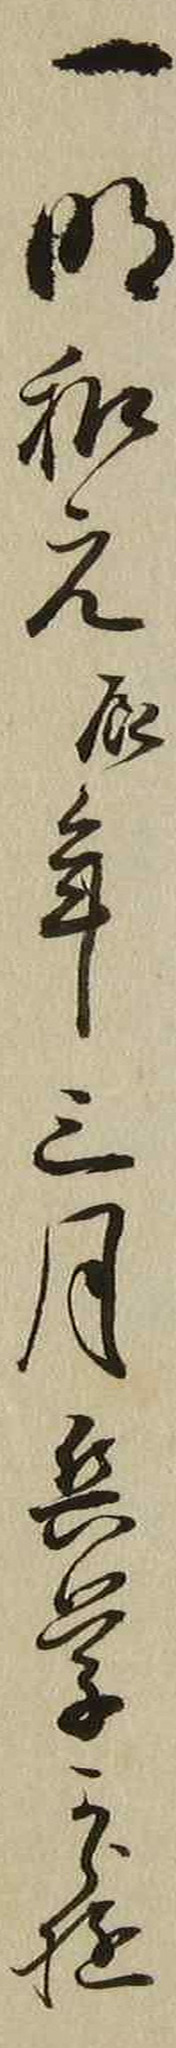一明和元辰年三月兵学可被遊
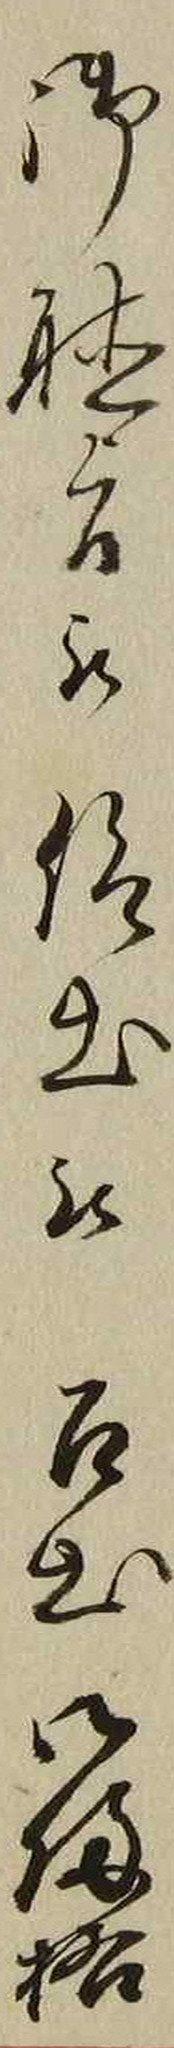御聴旨被仰出被召出御備格
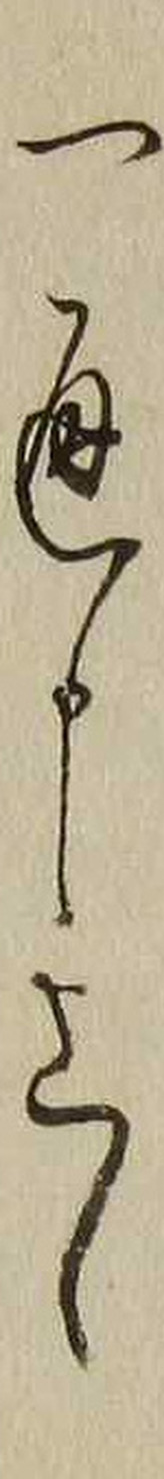一通申上候
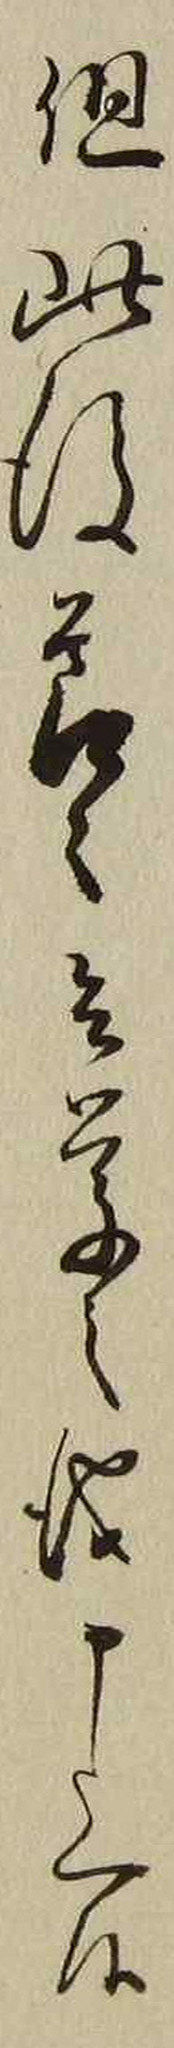但此後節々兵学之儀申上候
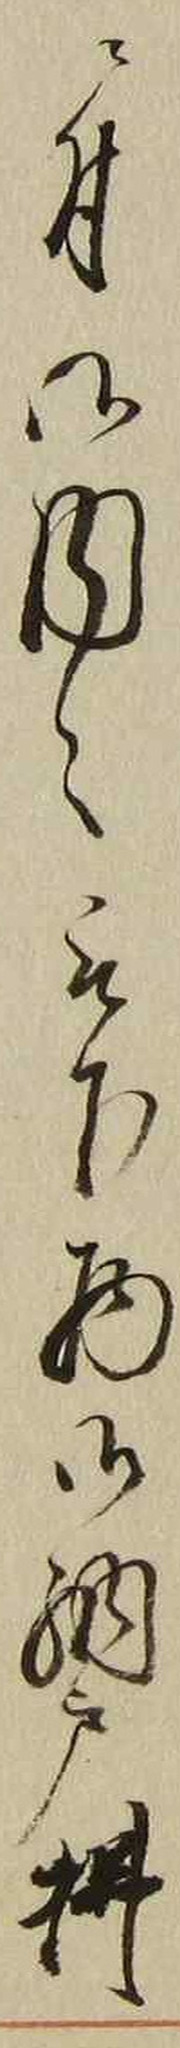ニ付御内々被下物御納戸払
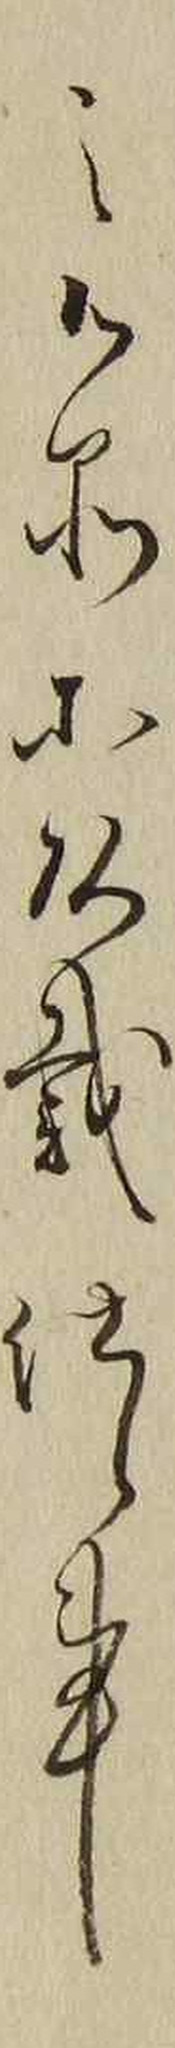之御品等頂戴仕候事
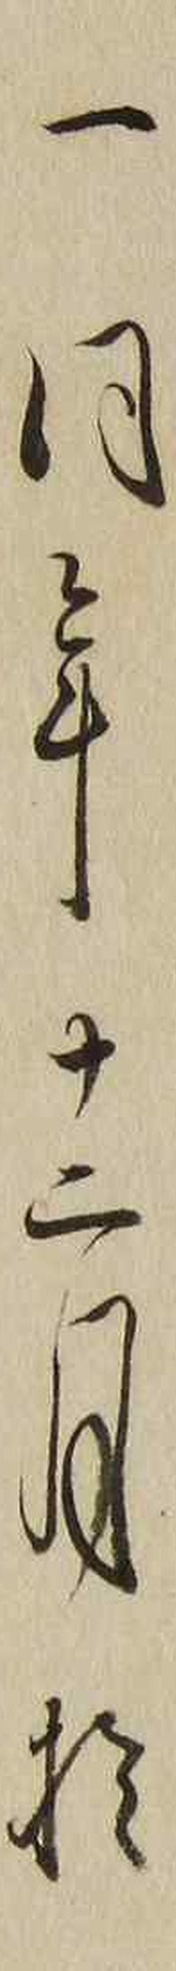一同年十二月於

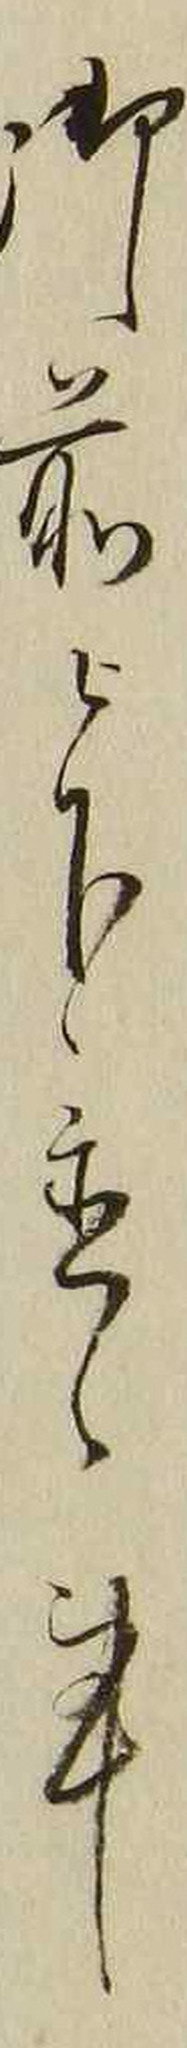御前被下置候事
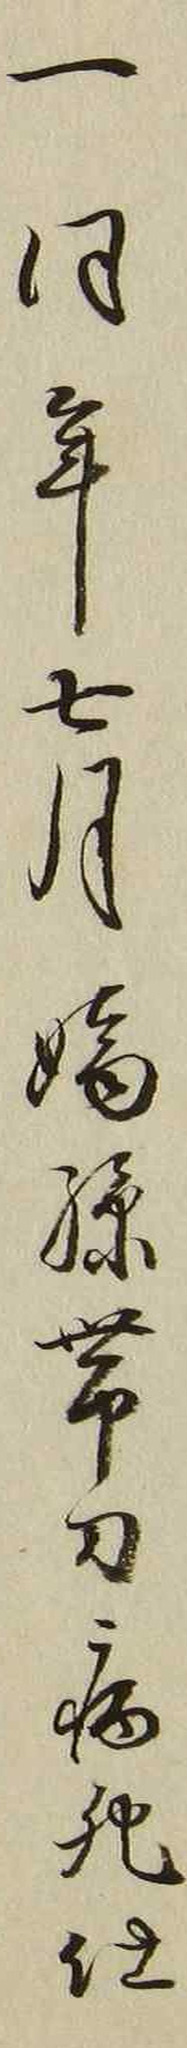一同年七月嫡孫帯刀病死仕
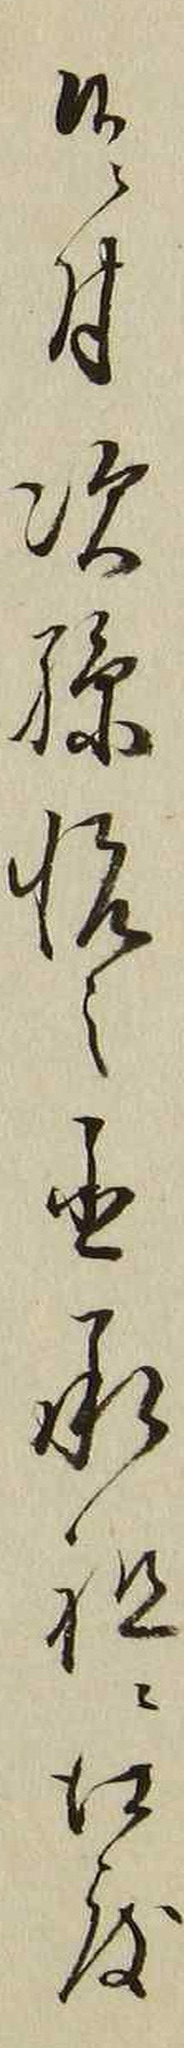候ニ付次孫悦之丞承祖ニ仕度
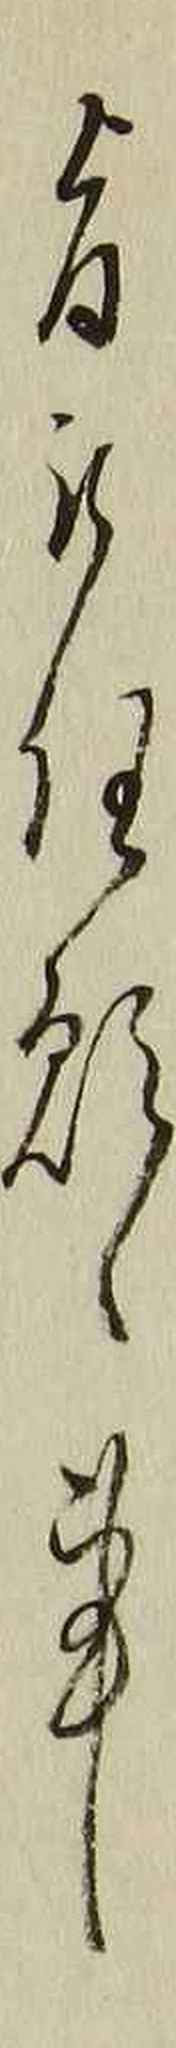旨任願候事
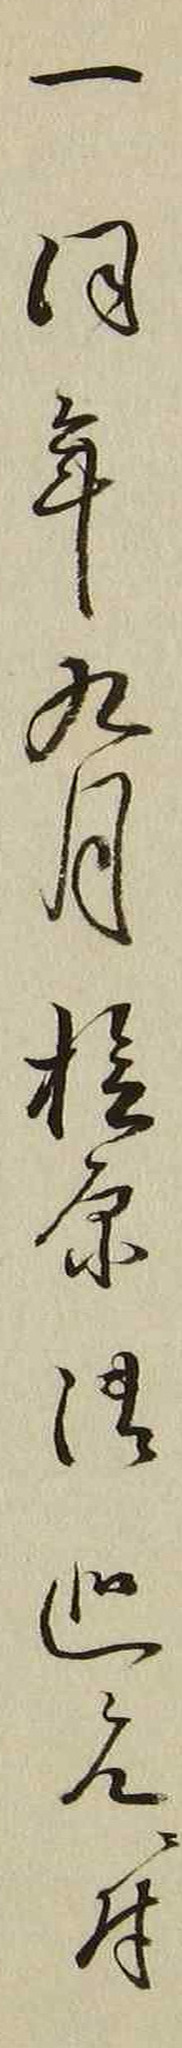一同年九月桧原御迎えニ付
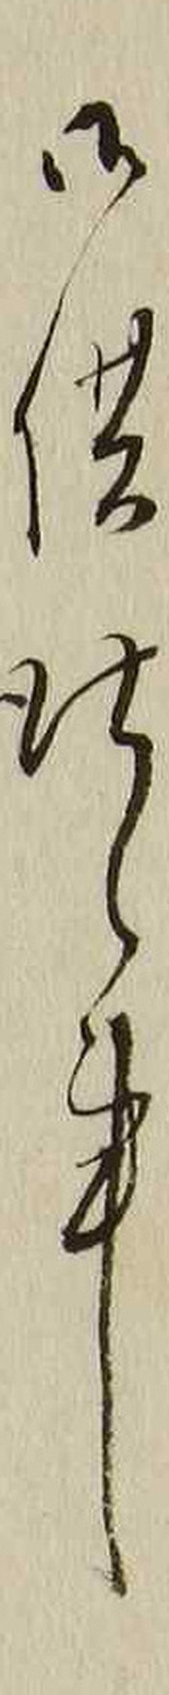御供仕候事
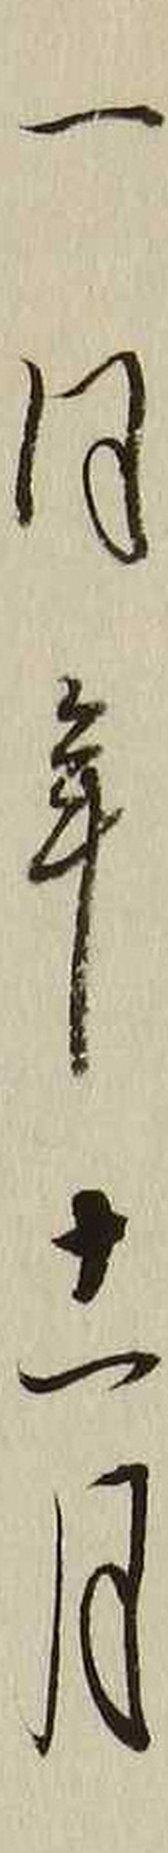一同年土月
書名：諸士系譜　巻之1　い之部1
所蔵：会津若松市立会津図書館
